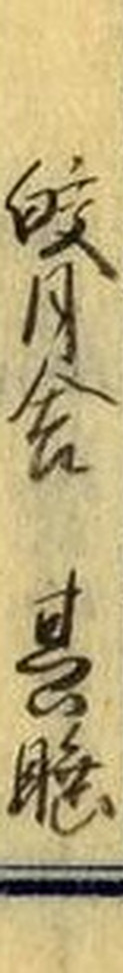皎月舎甚睡
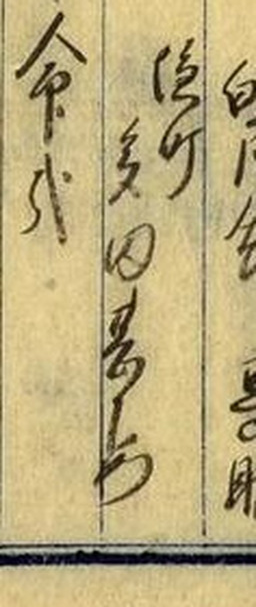多田甚右衛門
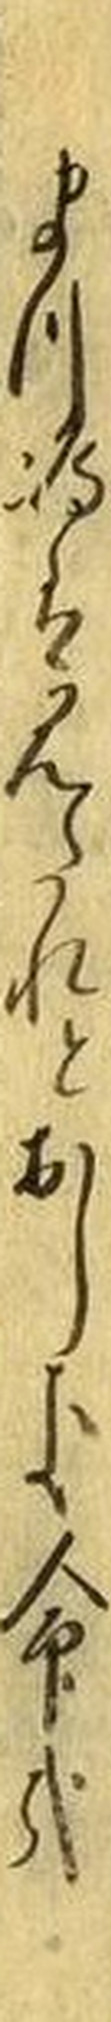まつ嶋は見たれおしき命哉
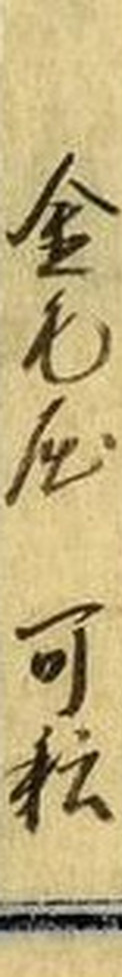金毛屋可秋
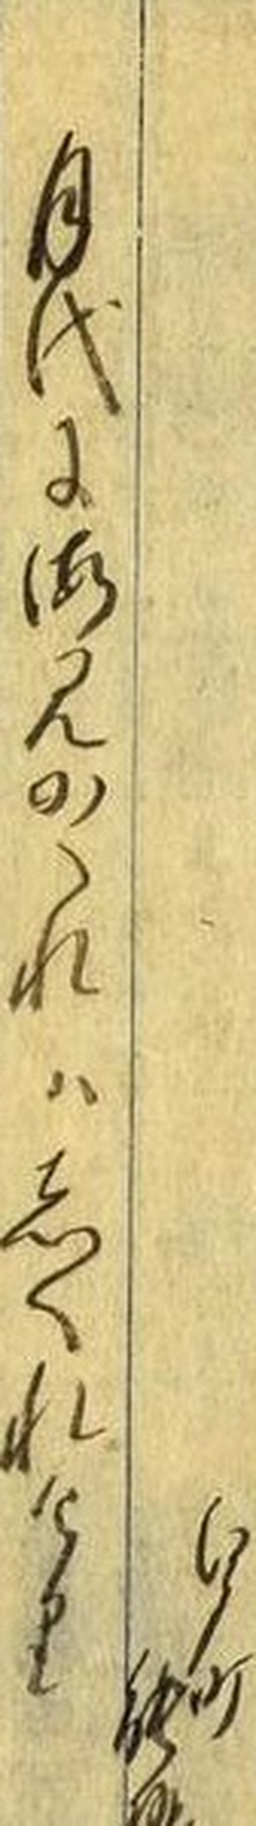月代に海見かゝれはしくれけり
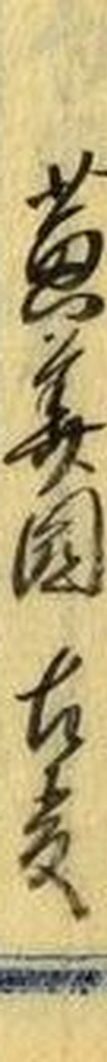黄美園古麦
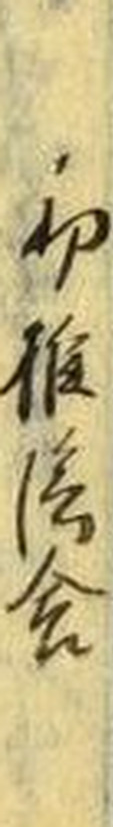初椎陰舎
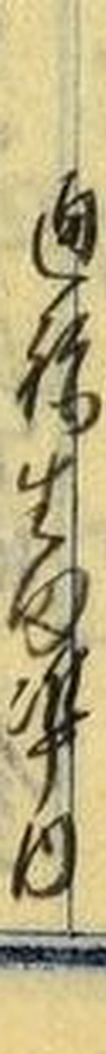通称生田準内
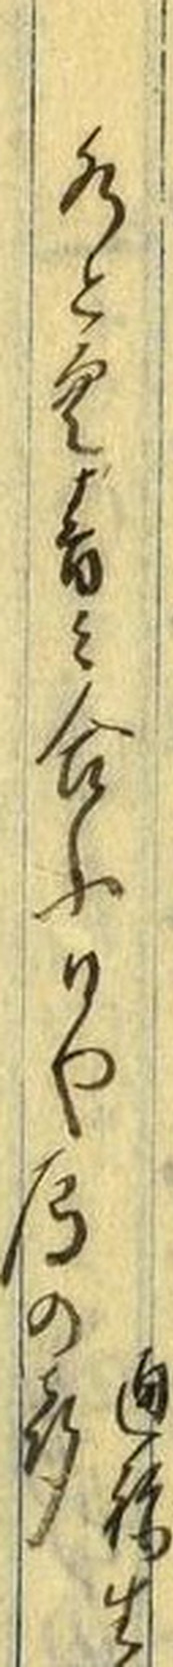水と空音は合ふ日や雁の声
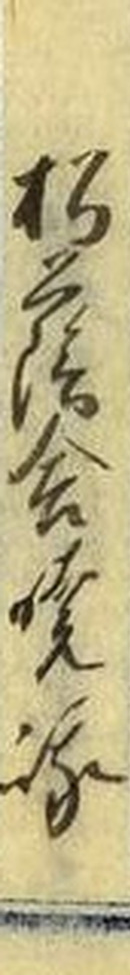松落舎暁琢
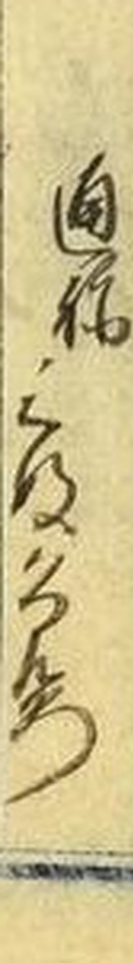通称三好久左衛門
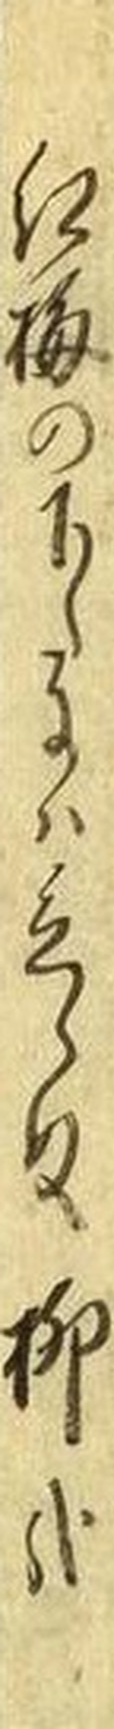紅梅の下たには立ゝぬ柳哉
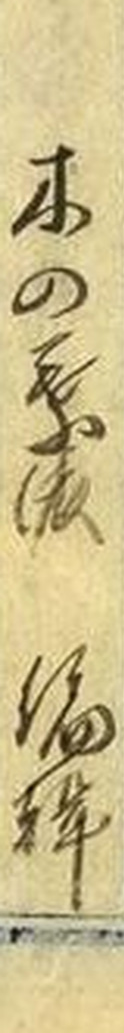木の葉猿？編輯

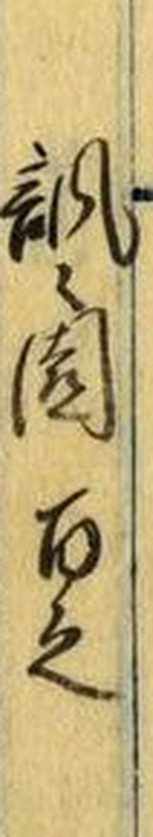諷々園百之
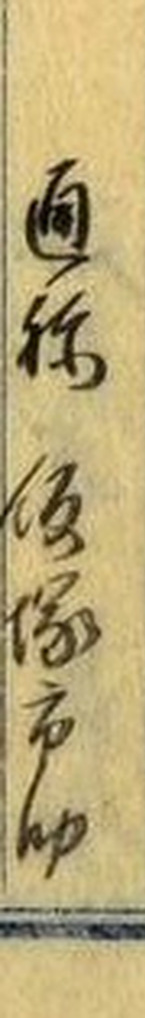通称飯塚市助
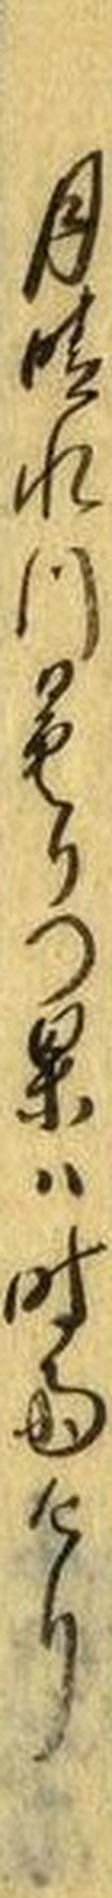月晴れつく曇りつ果は時雨けり
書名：温古集 三巻
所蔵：福井県文書館 Fukui Prefectural Archives
